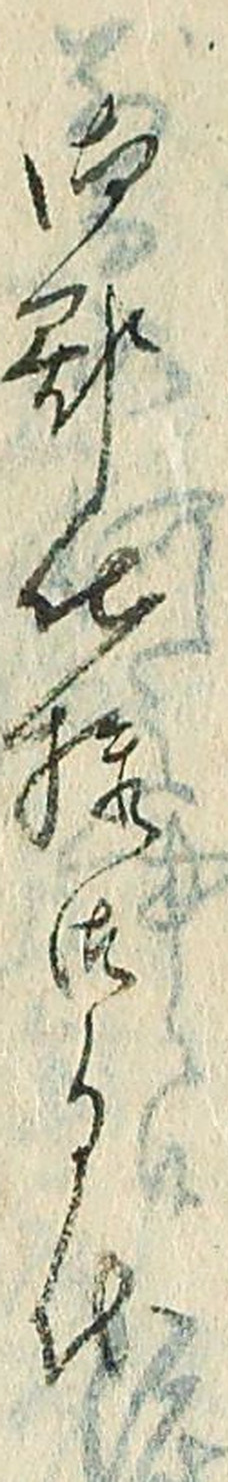御郡代様御手代
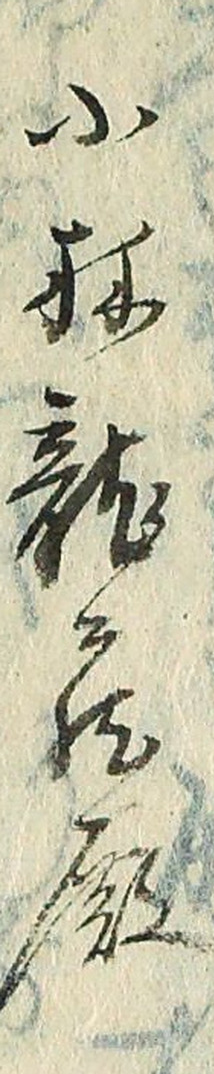小林龍蔵殿
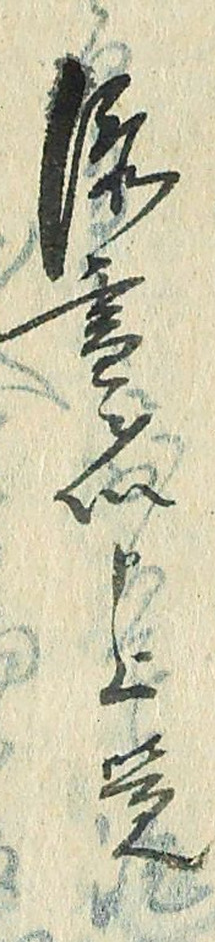添書を以申上覚
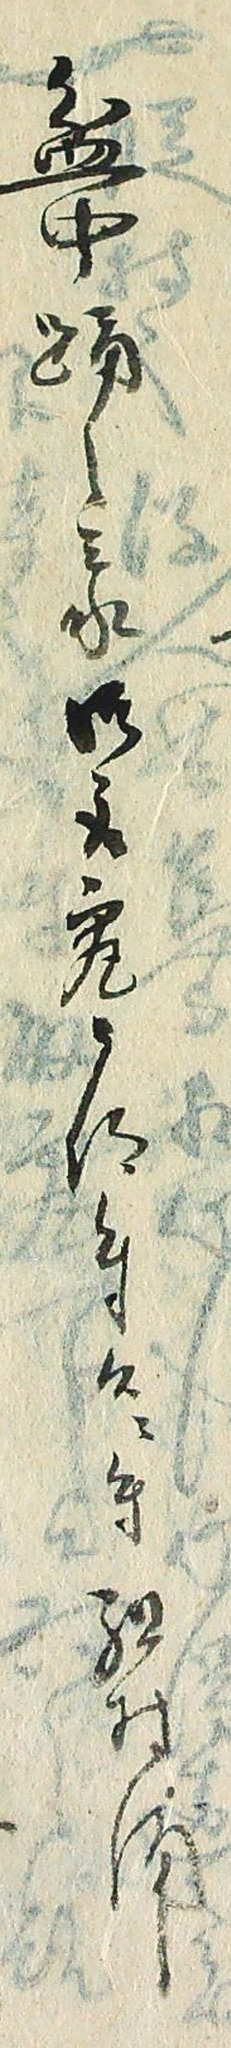盆中踊之義御取究被仰付候に付組村浦
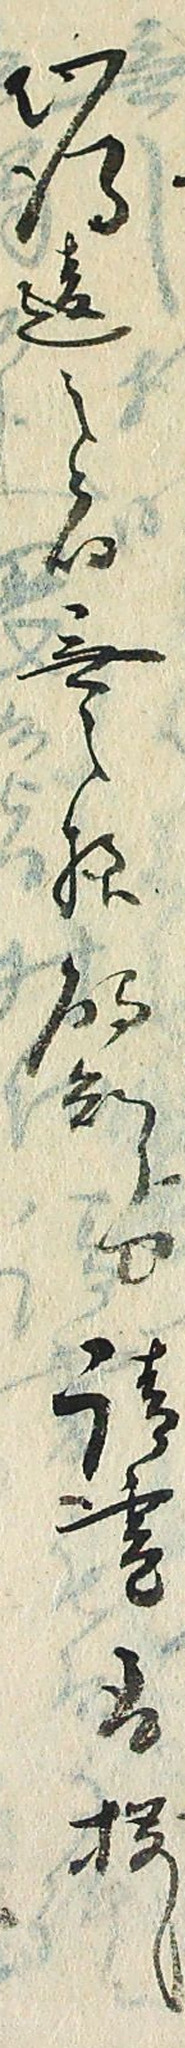心得違之者無之様触知らせ請書取揃へ
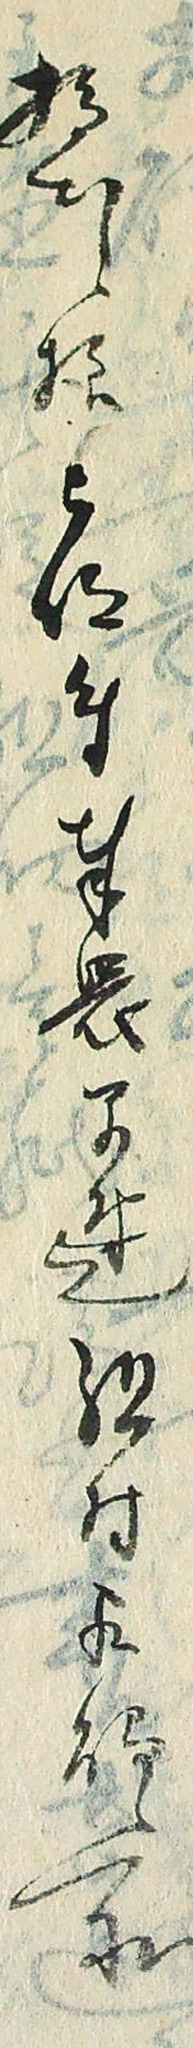指出候様被仰付奉畏早速組村相触候所
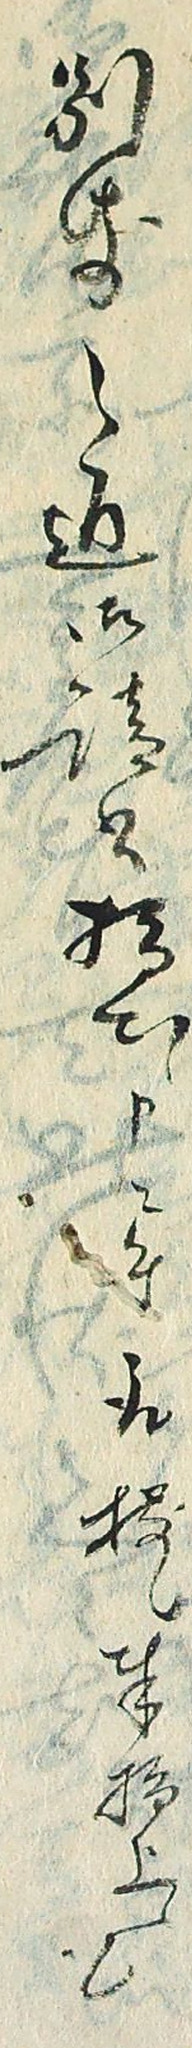別帋之通御請書指出申に付取揃へ奉指上候以上
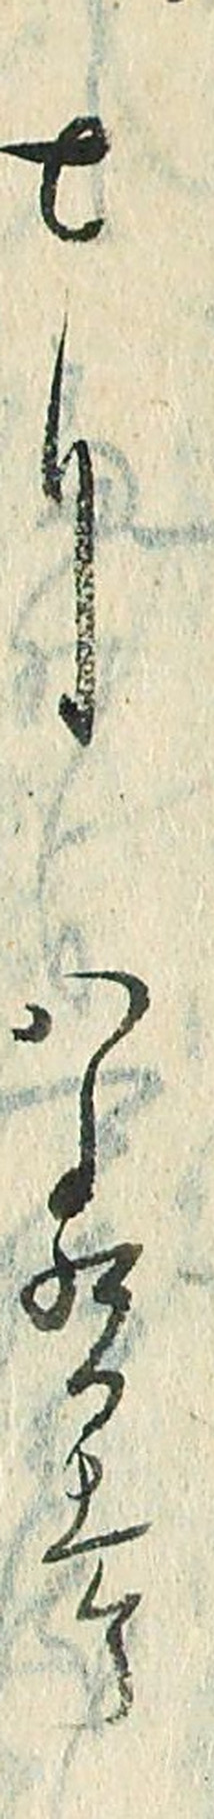七月八月九日上ケ
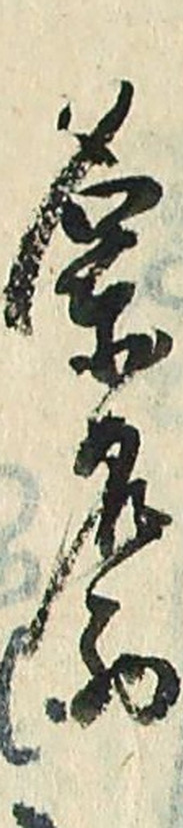名東名西
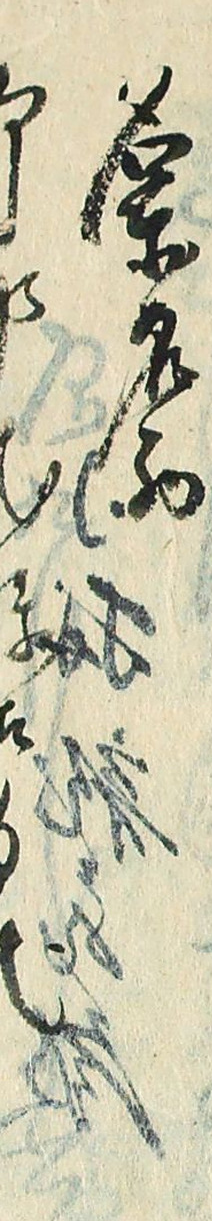名東名西
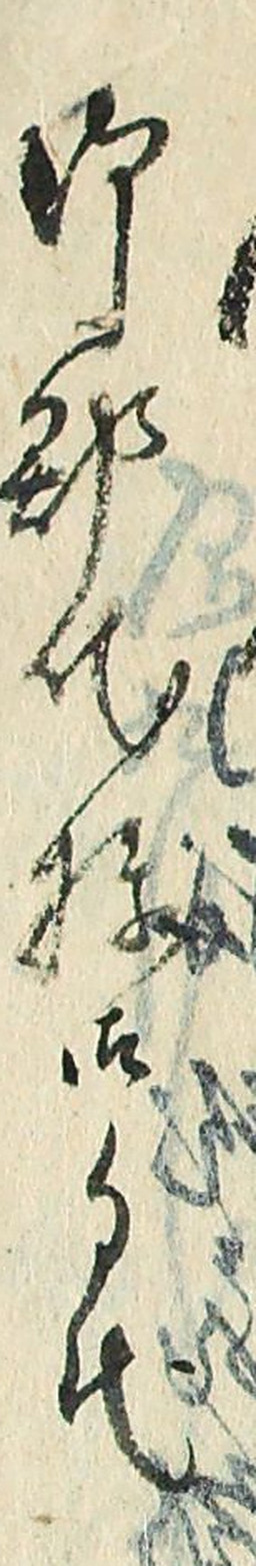御郡代様御手代

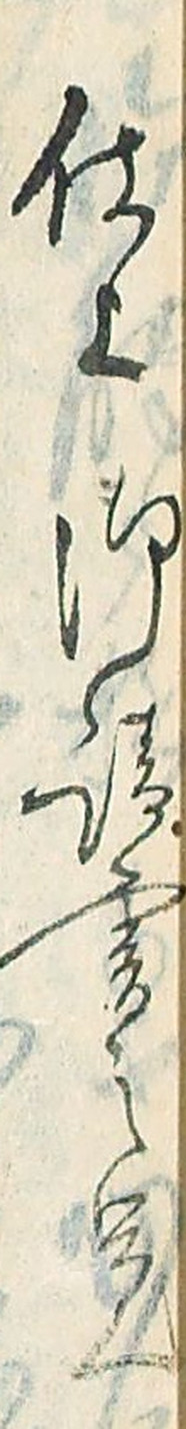仕上御請書之覚
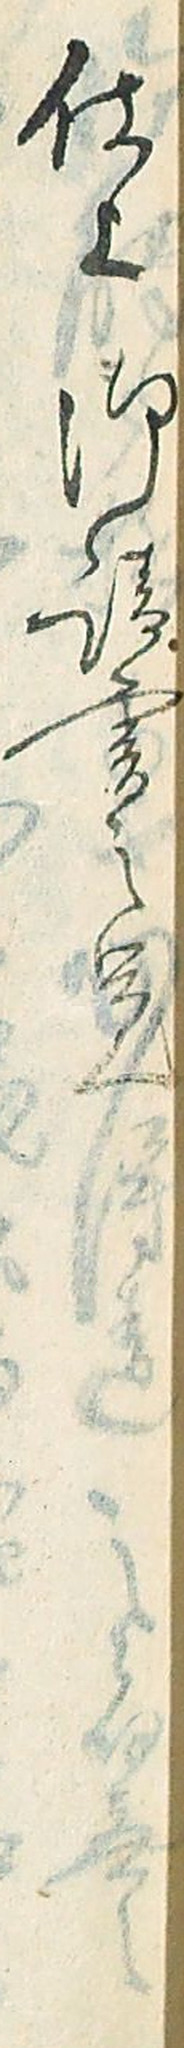仕上御請書之覚
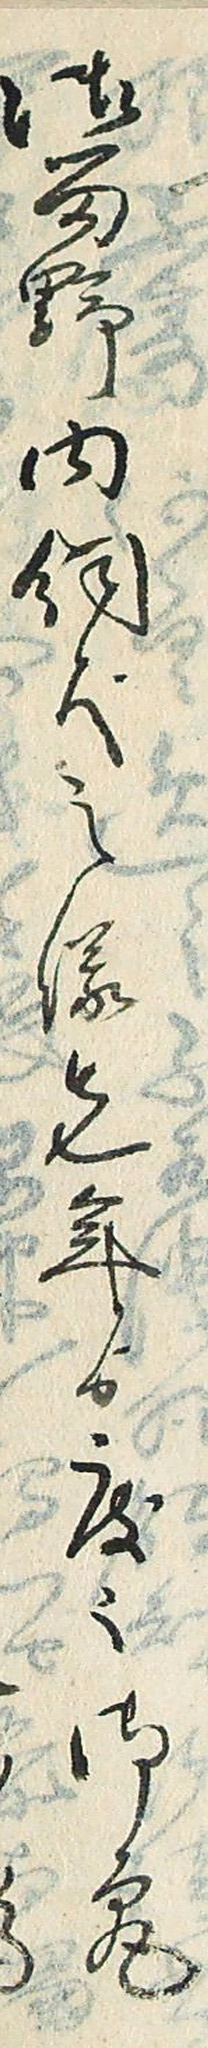御留野内飼犬之儀先年ゟ度々御究
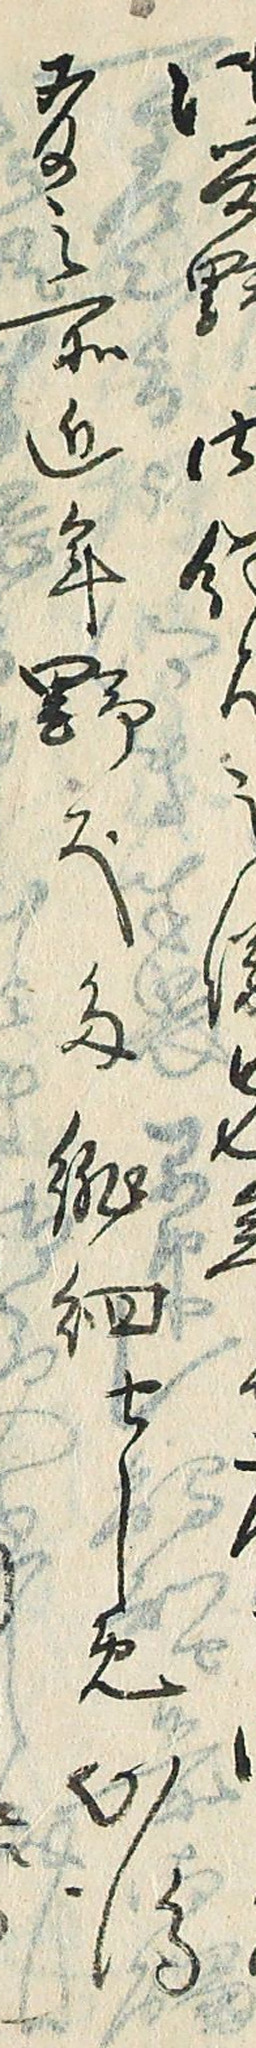有之候所近年野犬多徘徊せしめ心得
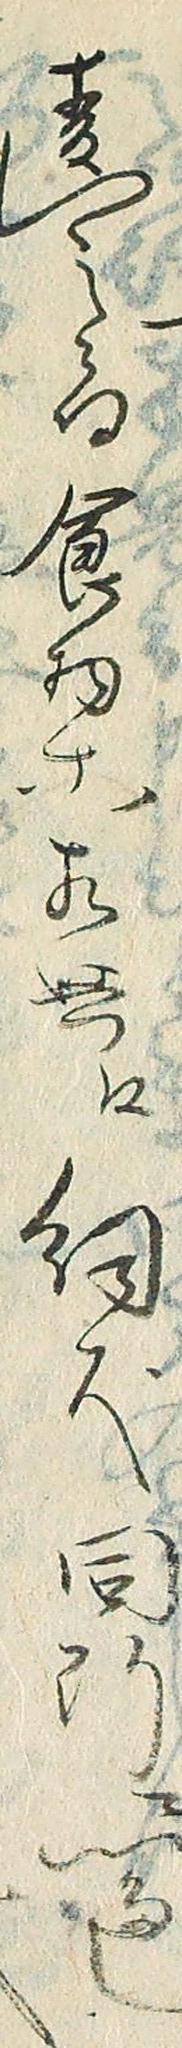違之者食物等相与え飼犬同断にいたし
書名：諸御用御□受書控
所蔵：鳴門教育大学 Naruto University of Education
